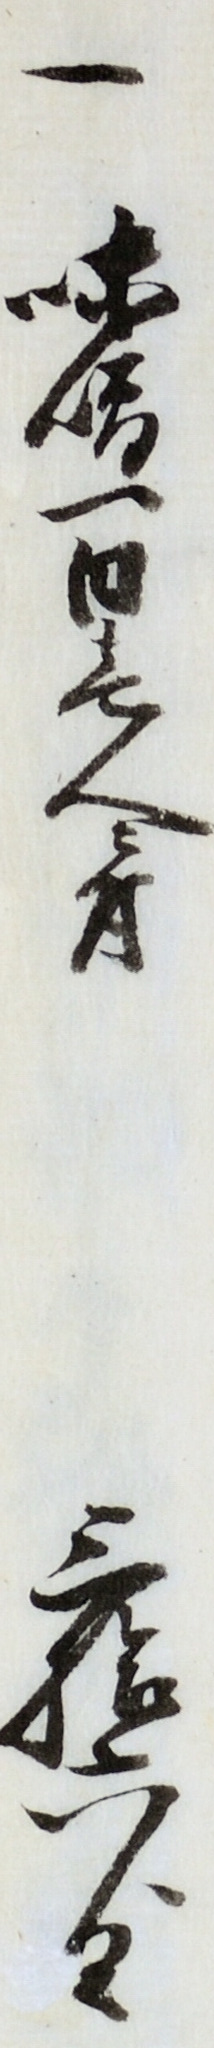一味噌一日壱人ニ付三拾六匁
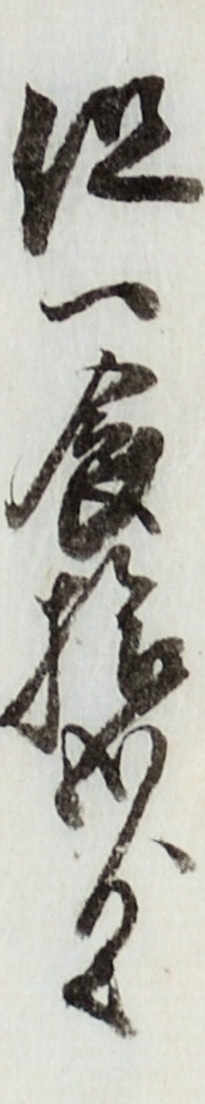但一食拾弐匁
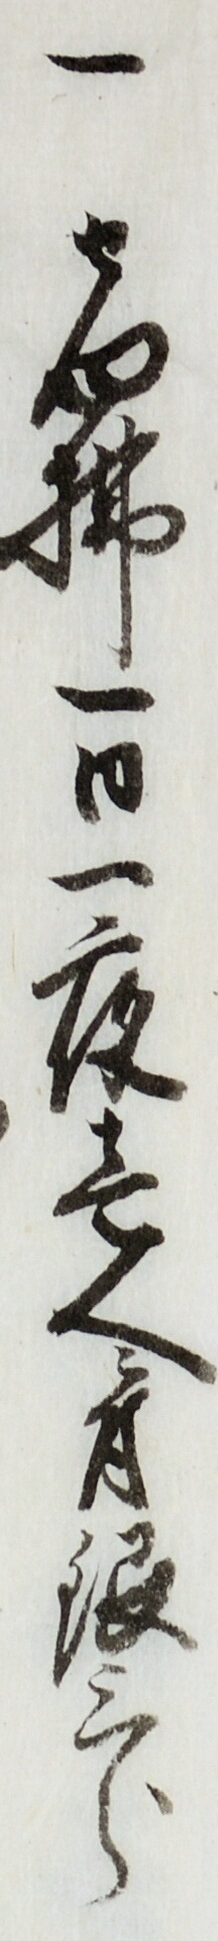一宿払一日一夜壱人ニ付銀三分
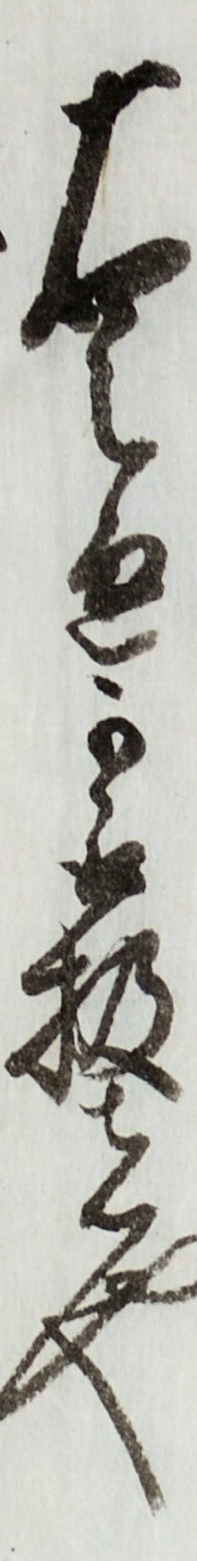右之通可取扱者也
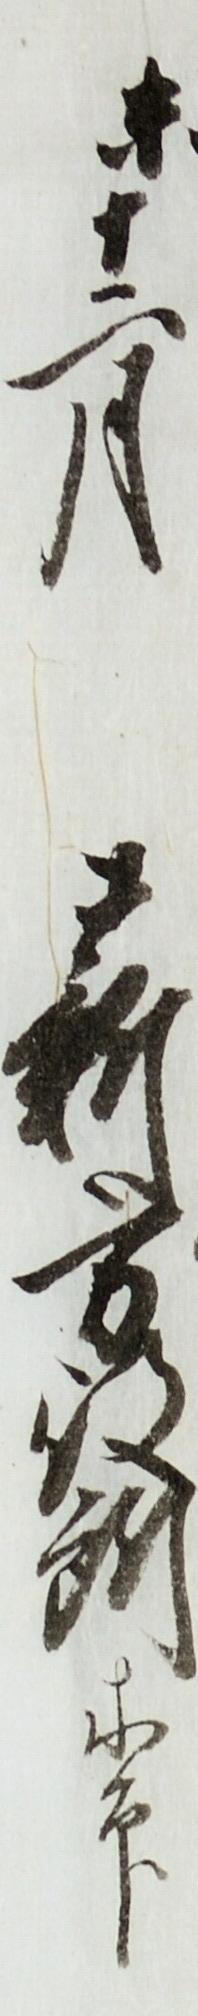未十二月薪方役所木印

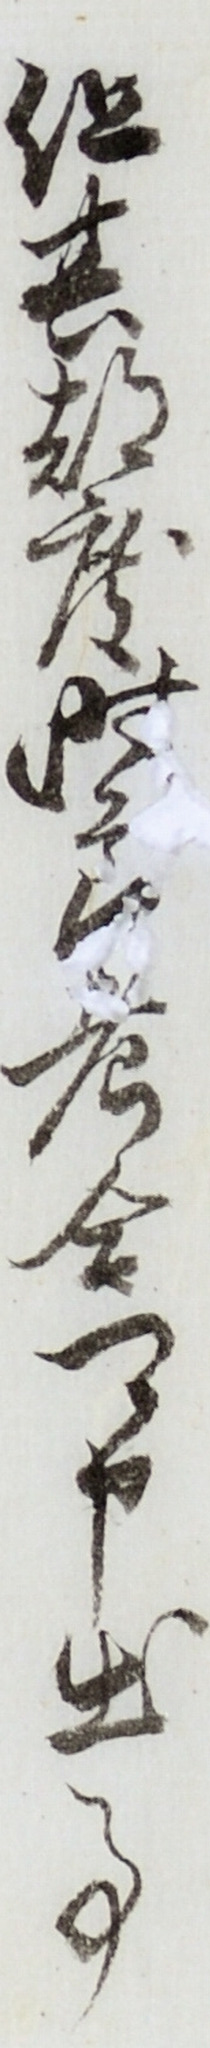但其都度時節考合可申出事
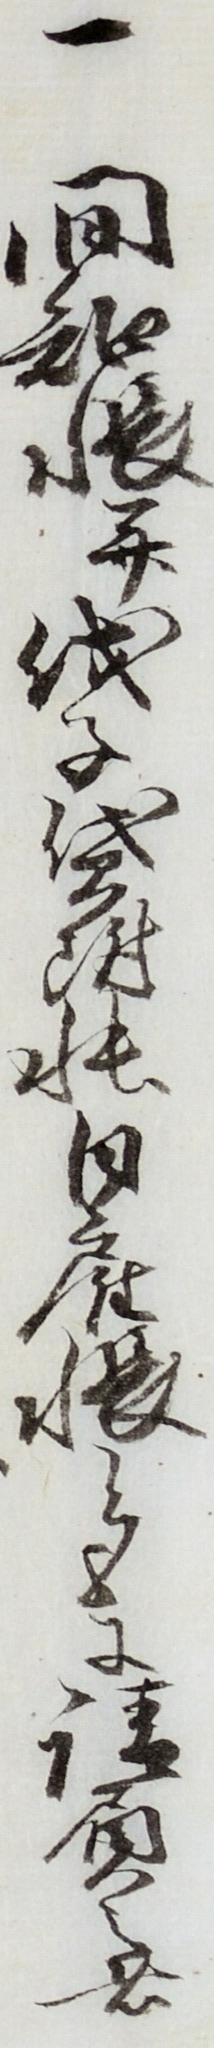一間知帳并伐子貸附帳日雇帳ともに請負之者
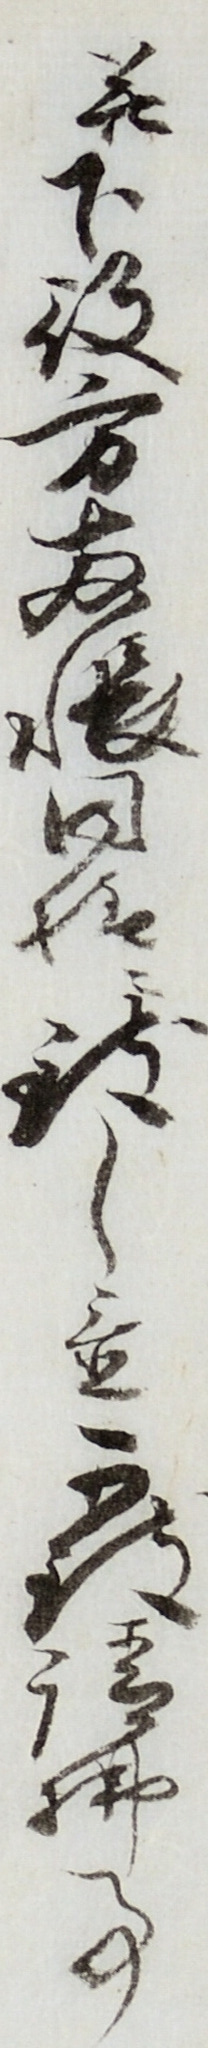并下役方両帳同様ニ致し置可致請払事
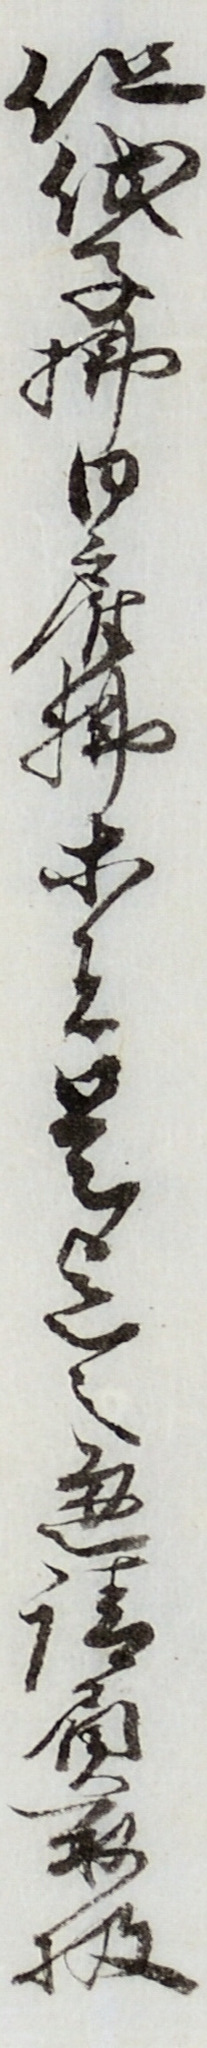但伐子払日雇払等者是迄之通請負取扱
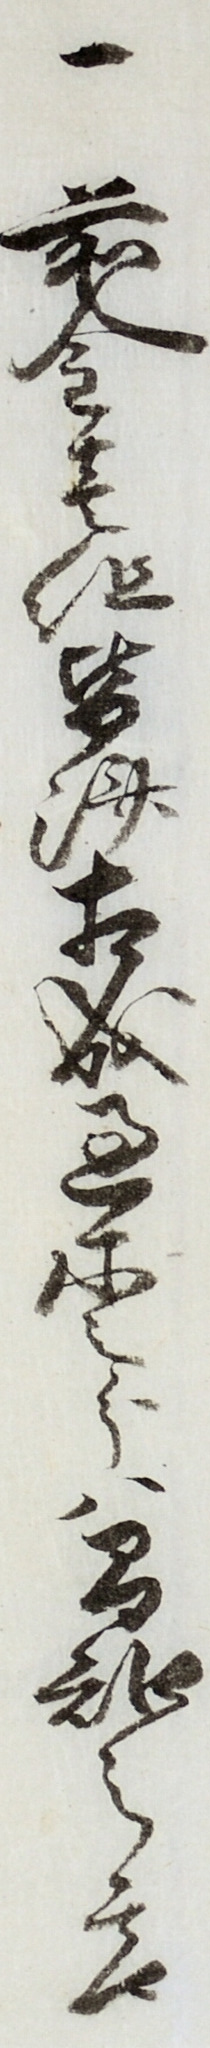一前金壱組皆済相成過木之分ハ間知之節
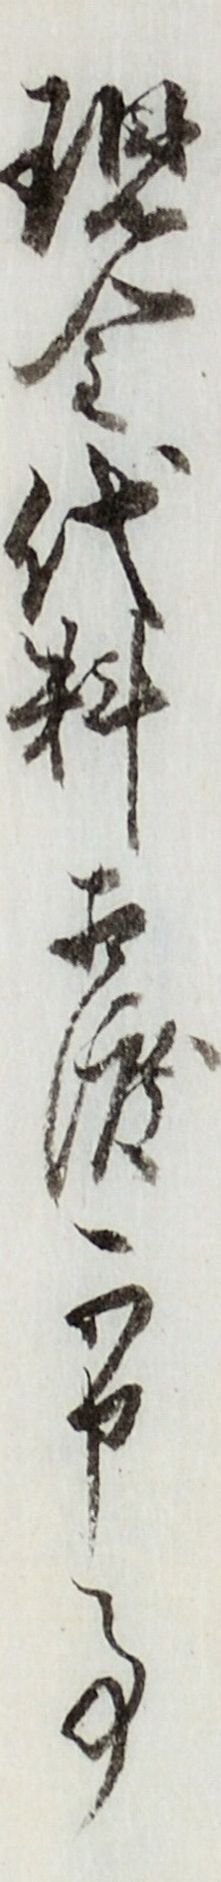現金代料相渡可申事
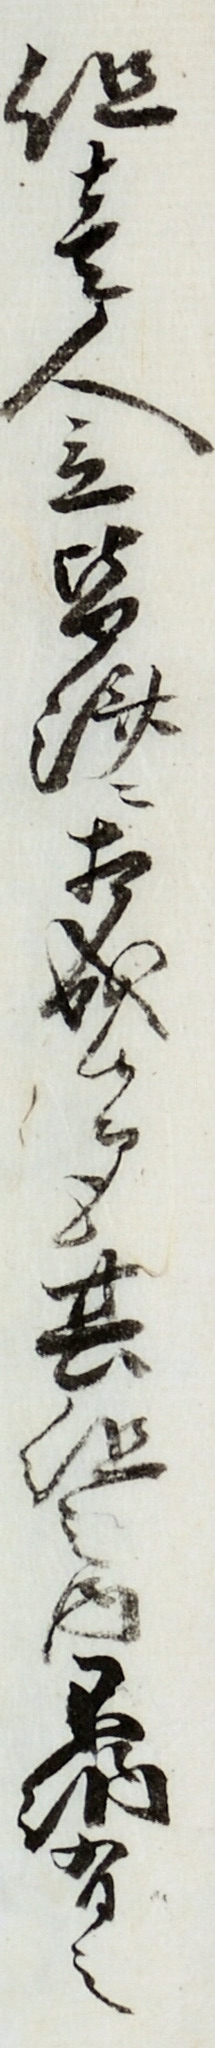但壱人立皆済ニ相成候而も其組之内不納有之
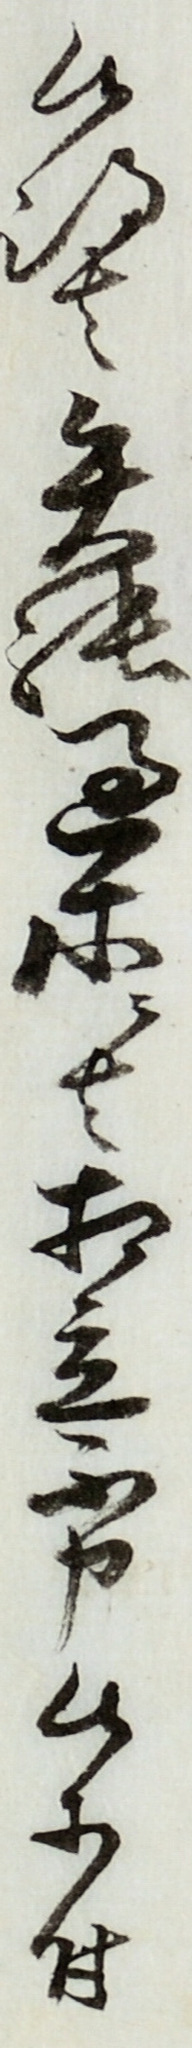候得者矢張過木ニ者相立不申候に付
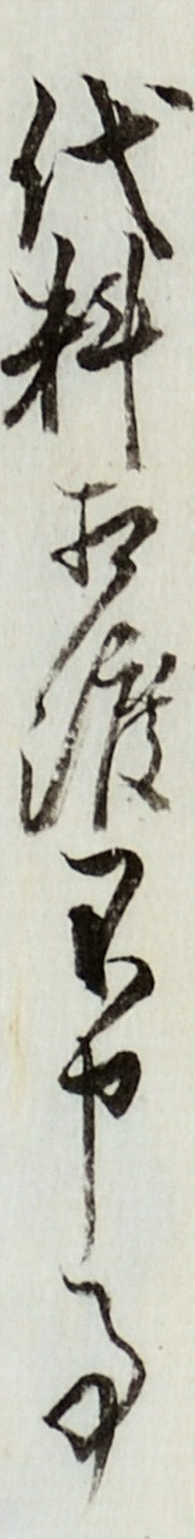代料相渡不申事
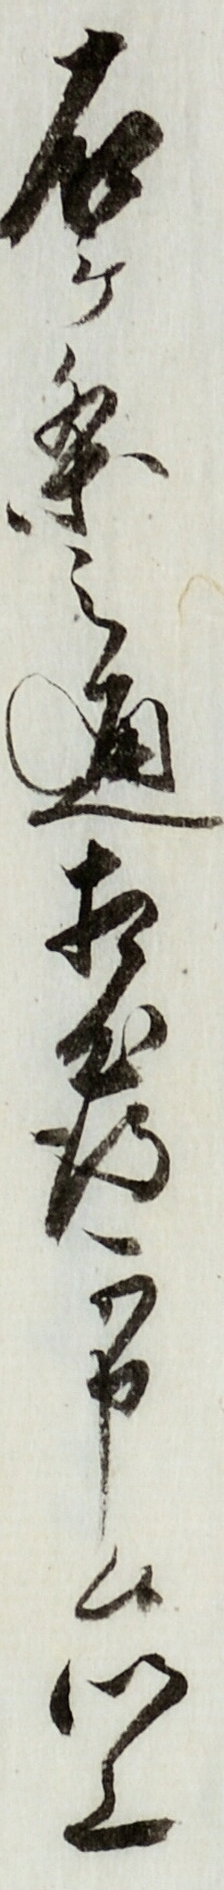右ヶ条之通相心得可申候以上
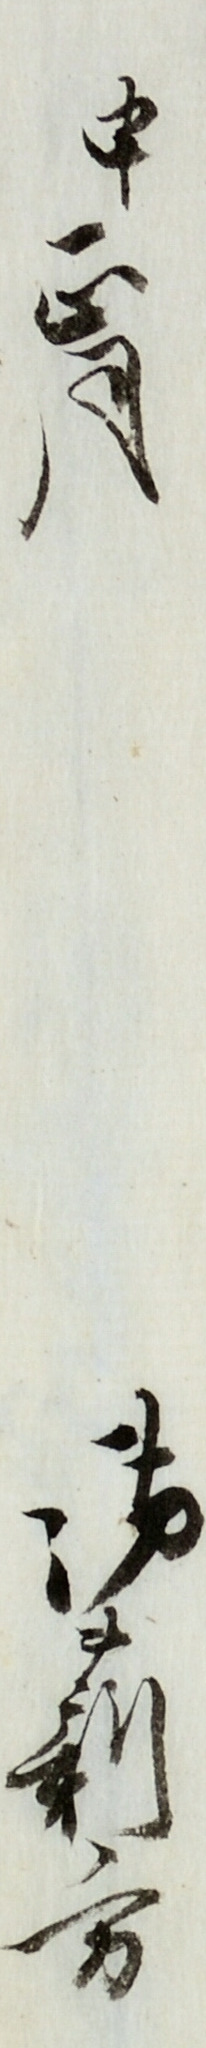申正月御薪方
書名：御薪方掟控
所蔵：伊那市立高遠町図書館・合同会社AMANE
